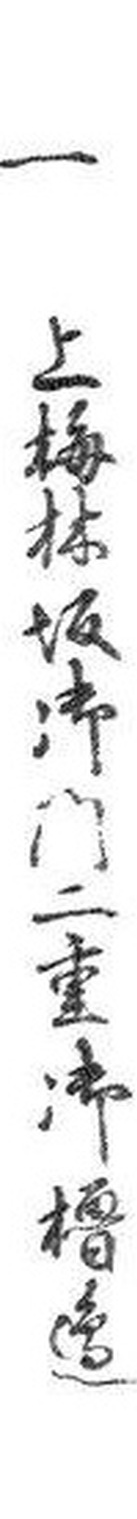一上梅林坂御門二重御櫓辺
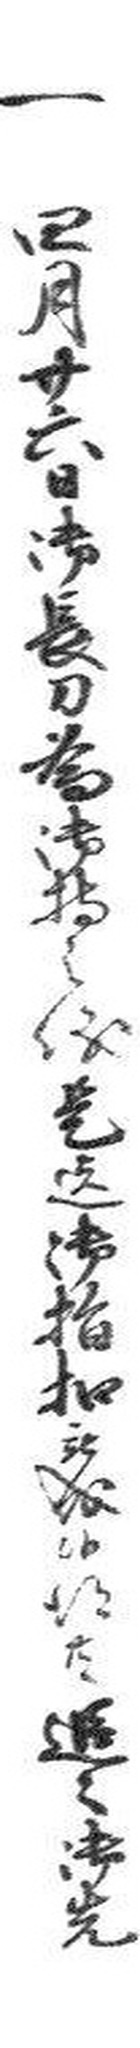一四月廿六日御長刀為御持之儀是迄御指控被成候得共追々御先
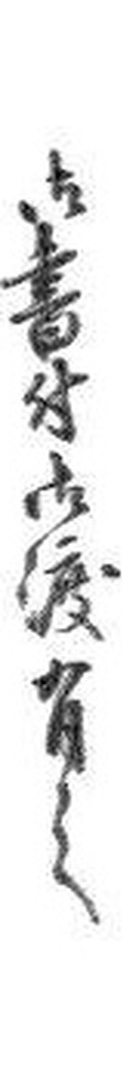御書付御渡有之
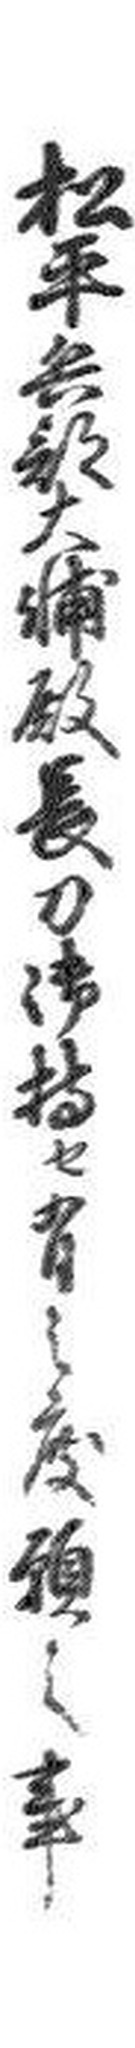松平兵部大輔殿長刀御持セ有之度願之事
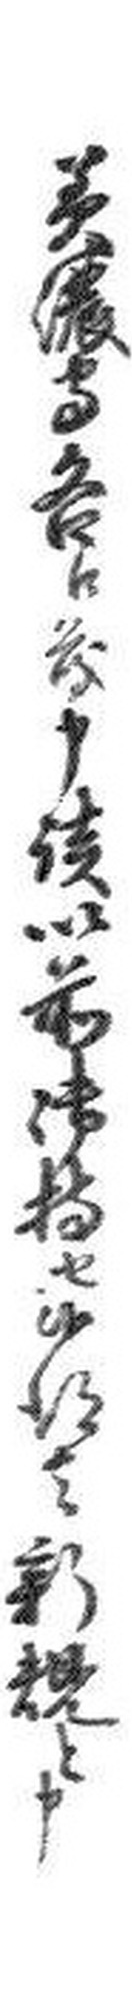美濃守各江茂申談以前御持セ候得者新規と申
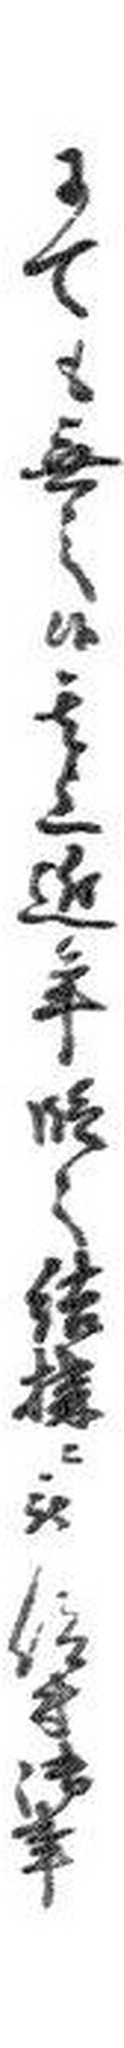にても無之候其上近年段々結構ニ被仰付御事
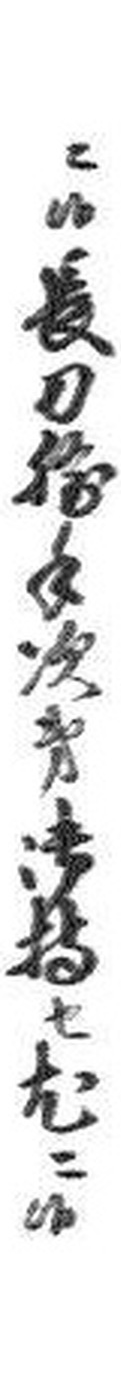ニ候長刀勝手次第御持セ尤ニ候
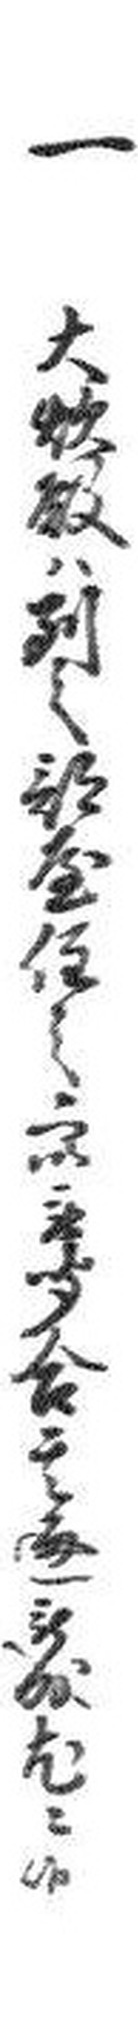一大炊殿ハ列之部屋住之衆被聞合其通被成尤ニ候
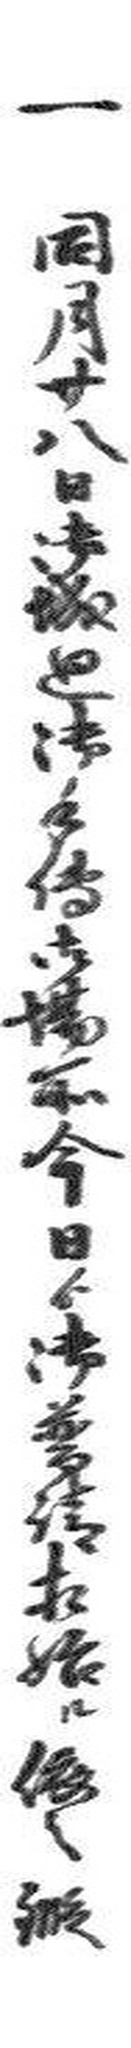一同月廿八日御城廻御手伝御場所今日ゟ御普請相始ル依之鍛
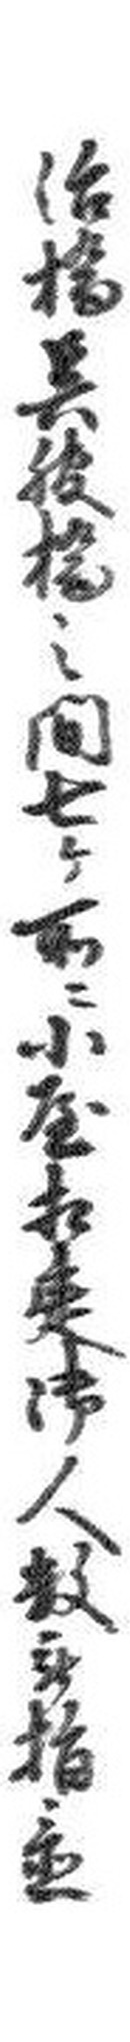冶橋呉服橋之間七ケ所ニ小屋相建御人数被指置

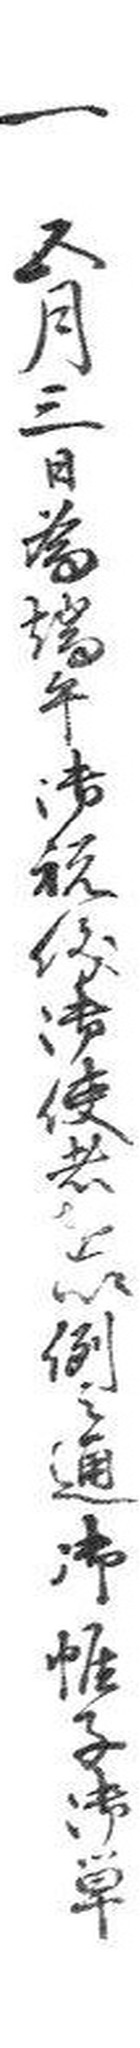一五月三日為端午御祝儀御使者を以例之通御帷子御単
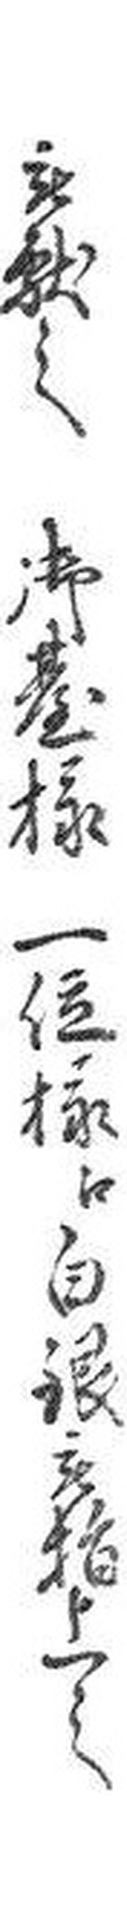被献之御台様一位様江白銀被指上之
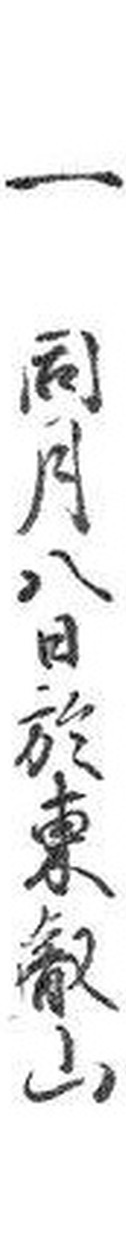一同月八日於東叡山
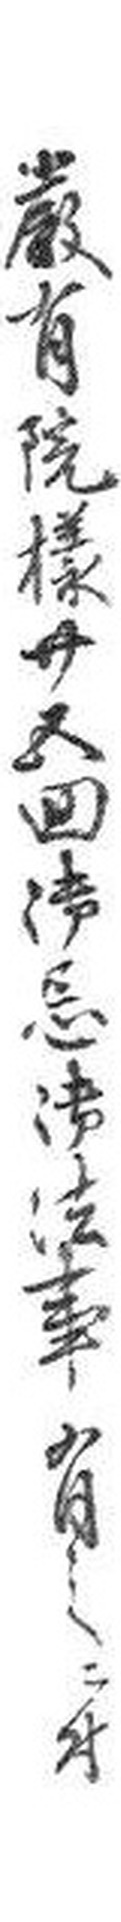厳有院様廿五回御忌御法事有之ニ付
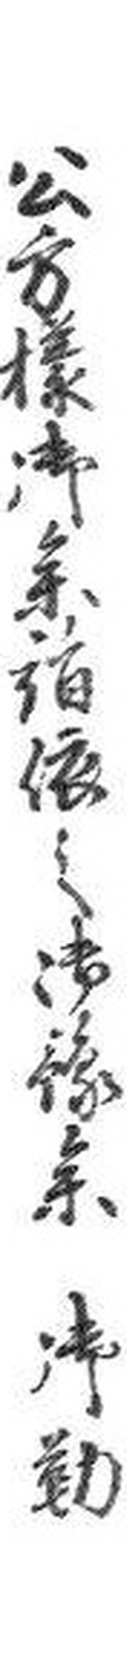公方様御参詣依之御予参御勤
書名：家譜 二十三 吉品公 従宝永元年到同二年
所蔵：福井県文書館 Fukui Prefectural Archives
